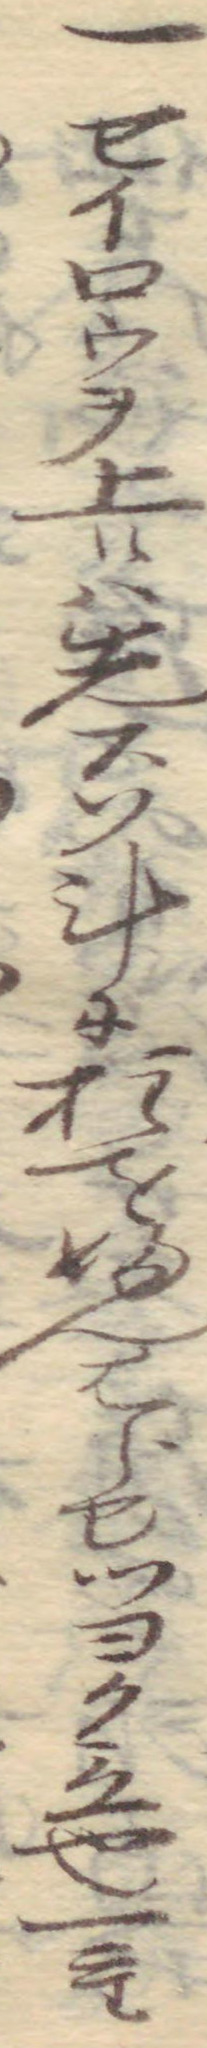一セイロウヲ上ルハ先スソ斗に柱をふんはらせツヨク立也一重
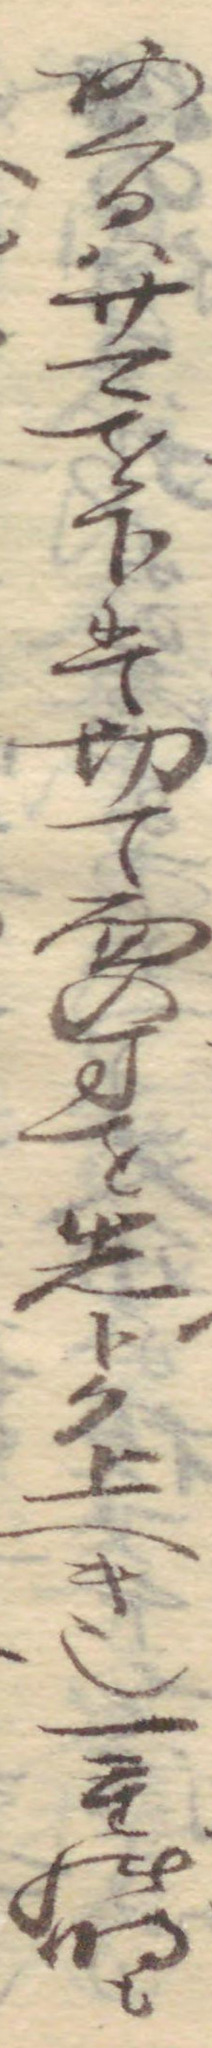あくるハサマを下にて切て面の方を先トク上ヘキ也一重の時も
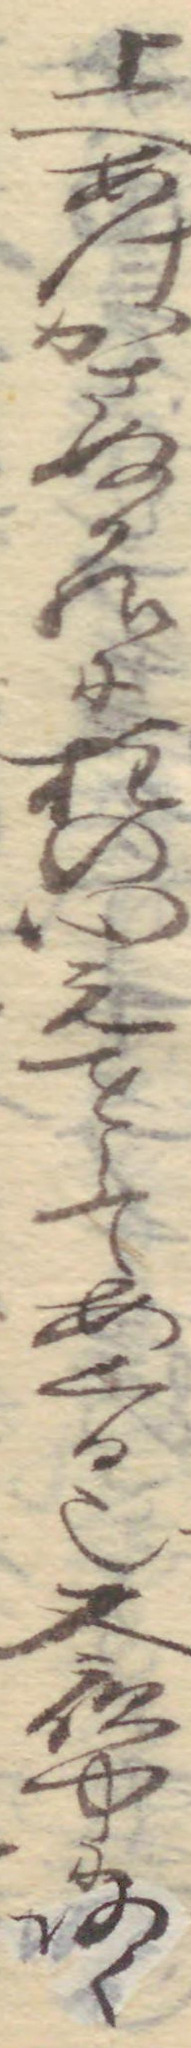上へあけかさぬる様に柱の心えをしてあくる也又夜中にあく
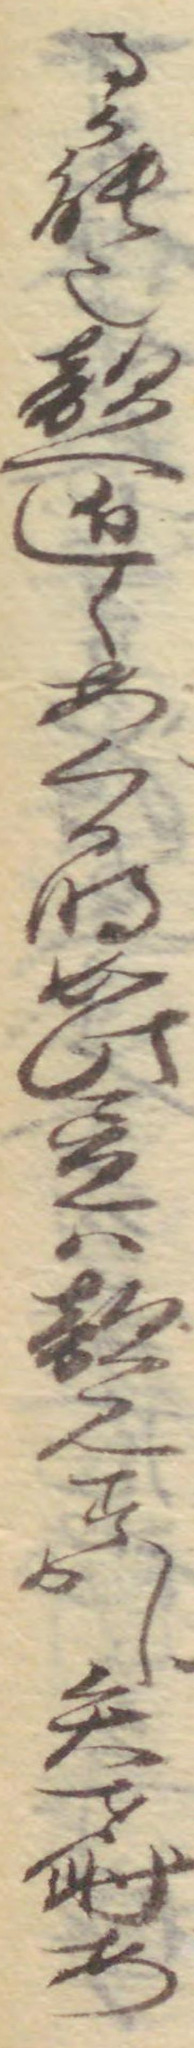るか能也敵へ近くあくる時如此昼ハ敵見すかし矢を射あ
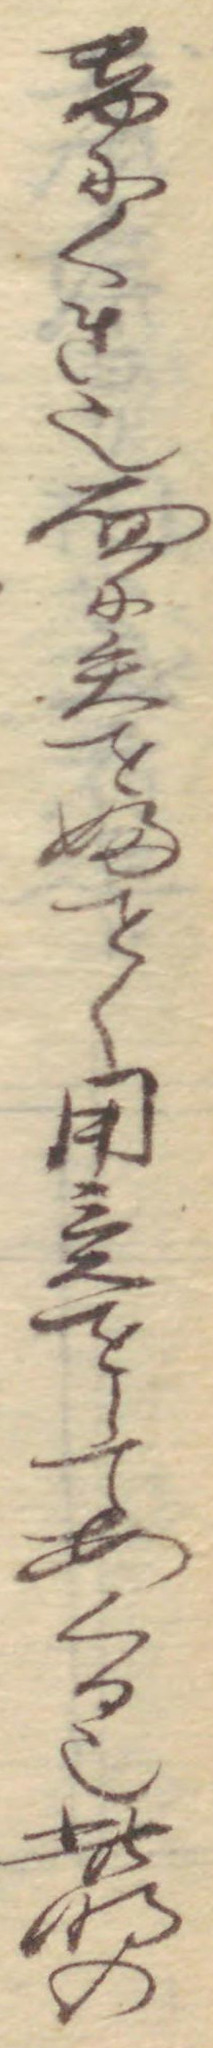けにくき也面に矢をふせく用意をしてあくる也此時の
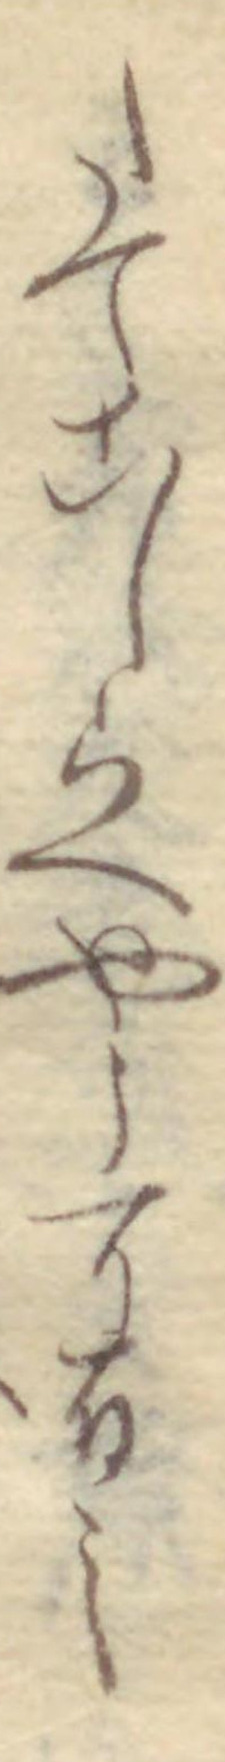たてこしらへやう可有之
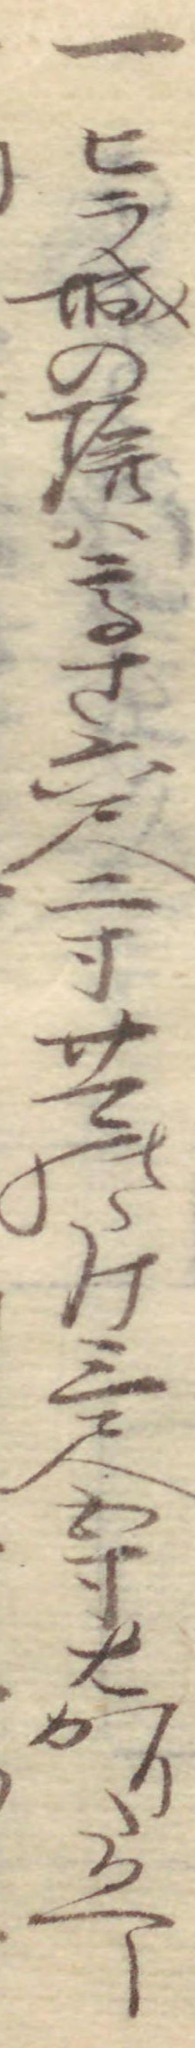一ヒラ城の塀ハ高さ六尺二寸サマのたけ三尺五寸はかりたるへし
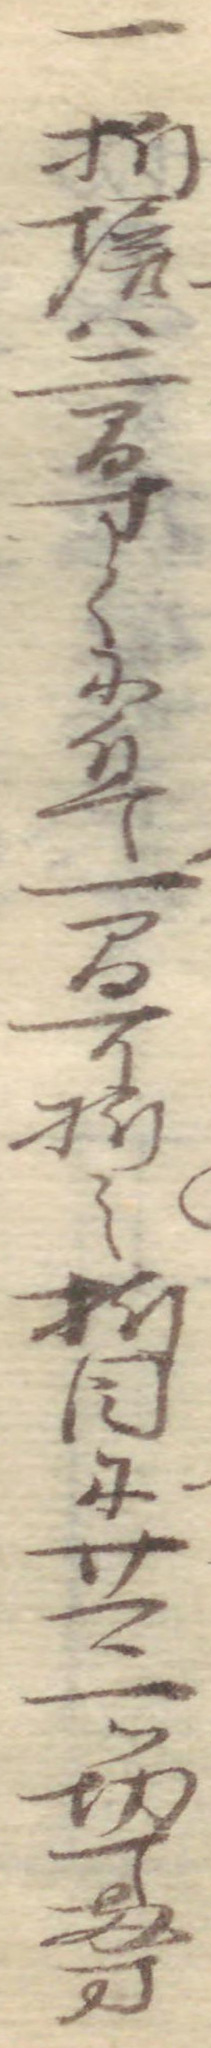一折塀ハ二間すくに付て一間可折之折目にサマ一ツ切て両方
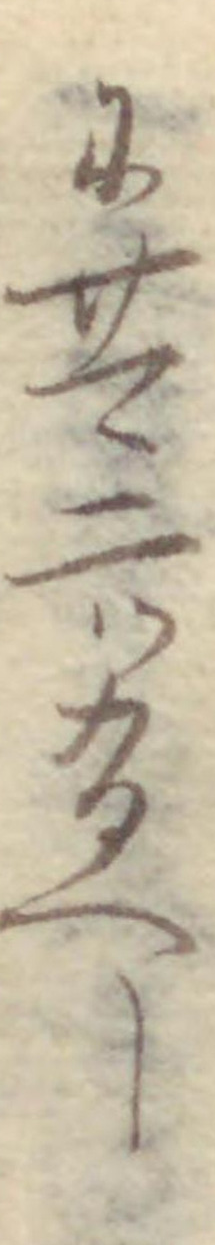にサマ二ツ有へし
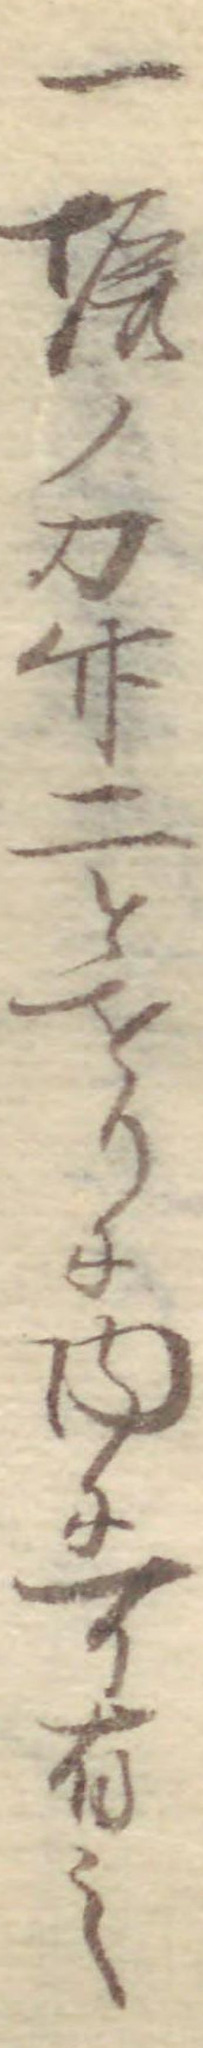一塀ノ刀竹二とをりに内に可有之
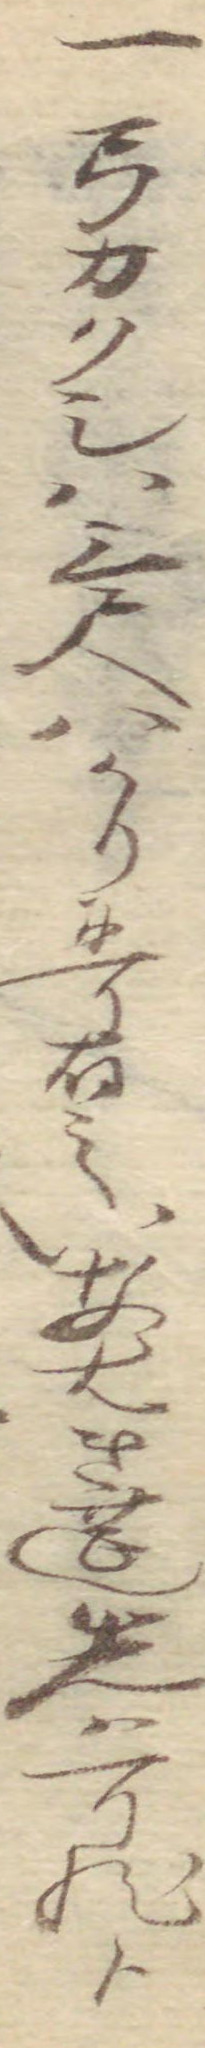一弓カクシハ三尺ハかりに可有之いなはき莚先ハ可然候
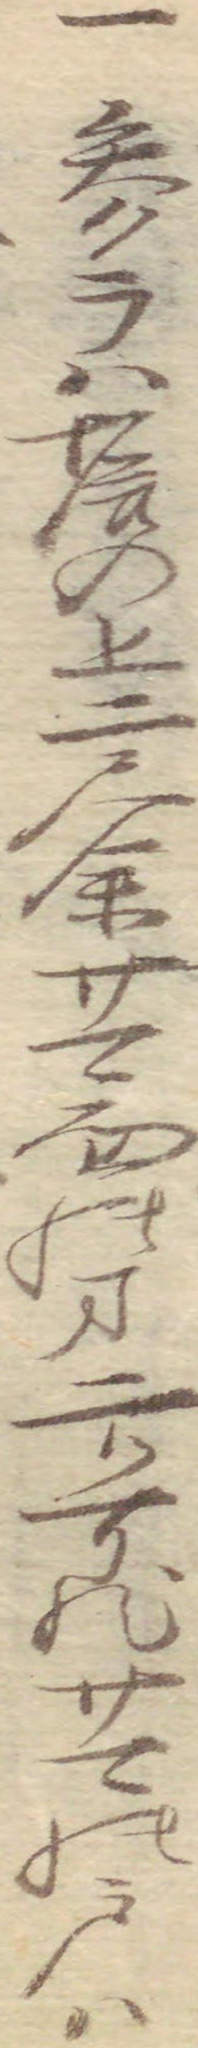一矢クラハ塀の上二尺余サマ面の方二ツ可然サマの戸ハ
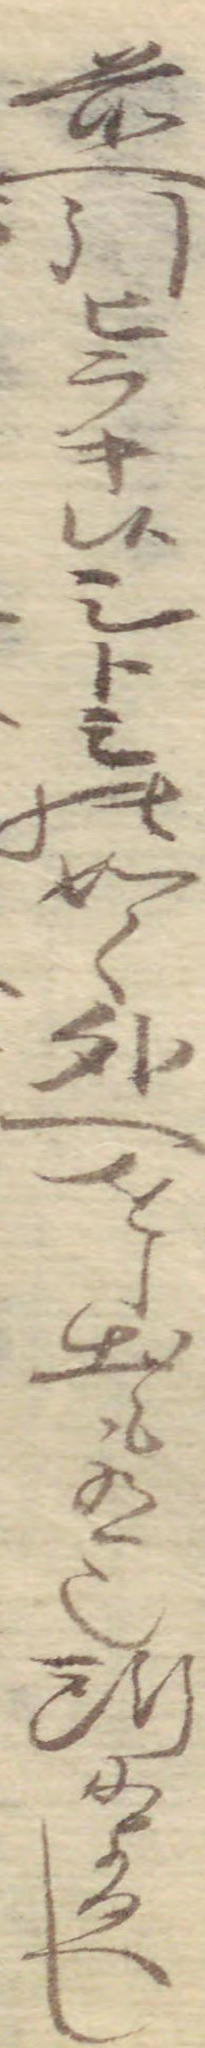前へ引ヒラキ候シトミの如く外へをし出も有之所によるへし
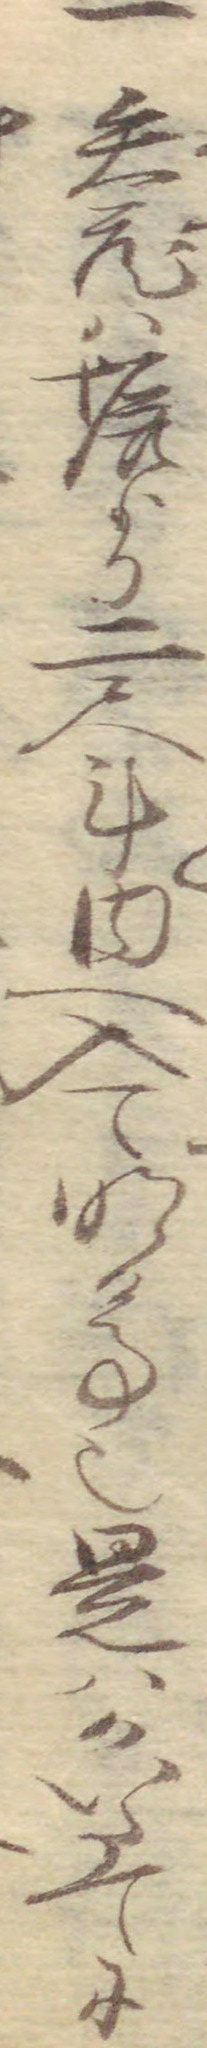一矢蔵ハ塀より二尺斗内へ入て明る事也是ハかいたてに
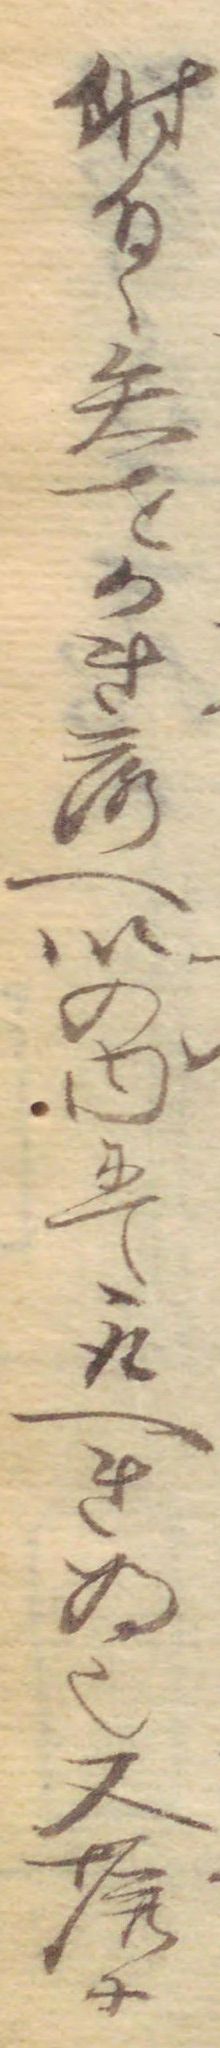射付候矢をかき落へいの内にて取へき為也又塀に

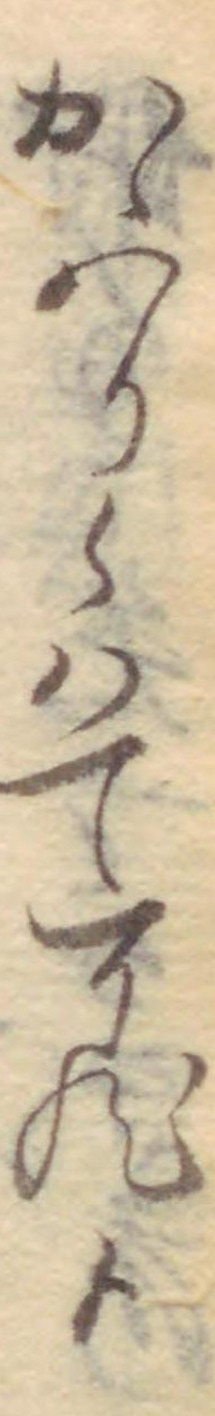かゝハり候はて可然候
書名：鶯宿雑記. 巻199-200
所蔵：国立国会図書館 National Diet Library, JAPAN
